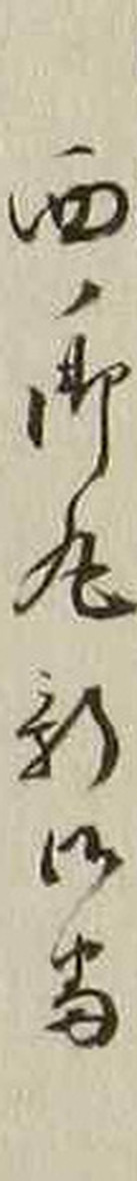西ノ御丸新御番
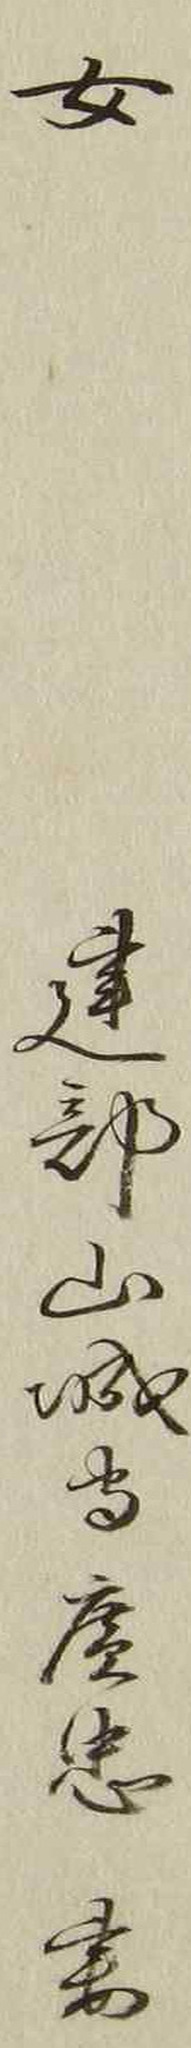建部山城守広忠妻
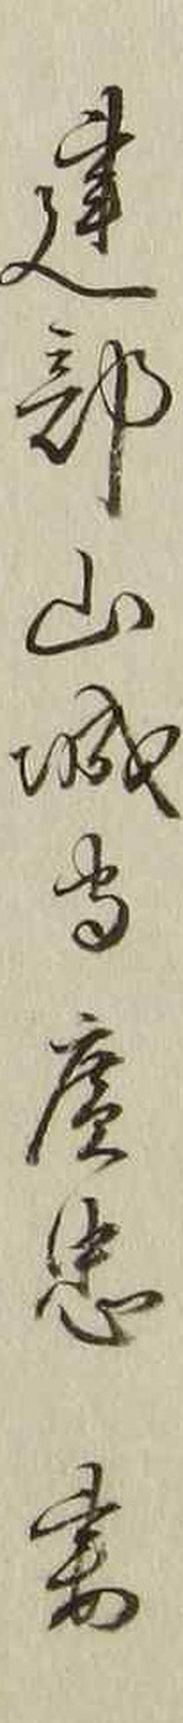建部山城守広忠妻
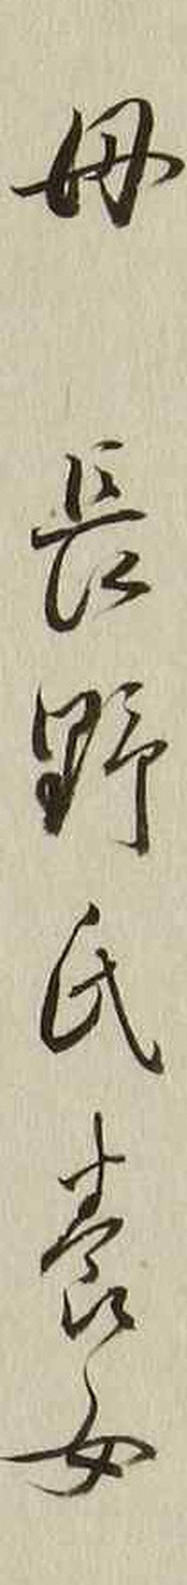母長野氏養女
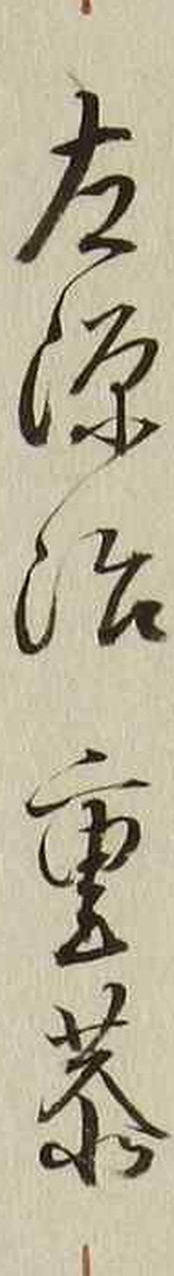左源治重恭
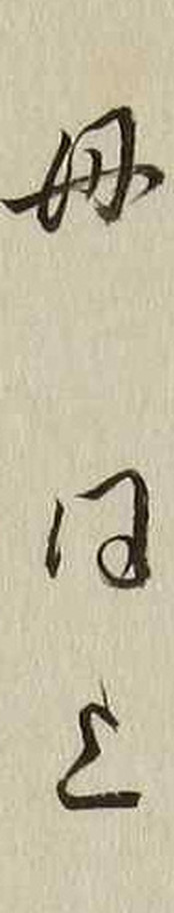母同上
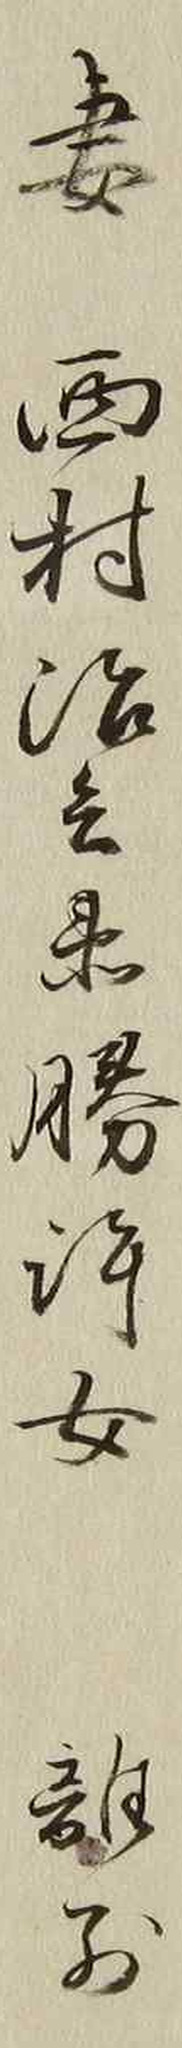妻西村治兵衛勝許女離別
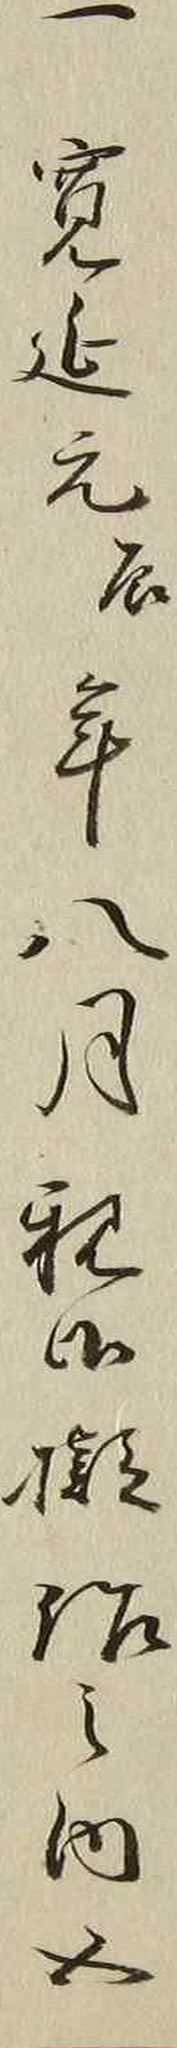一寛延元辰年八月親御擬作之内五
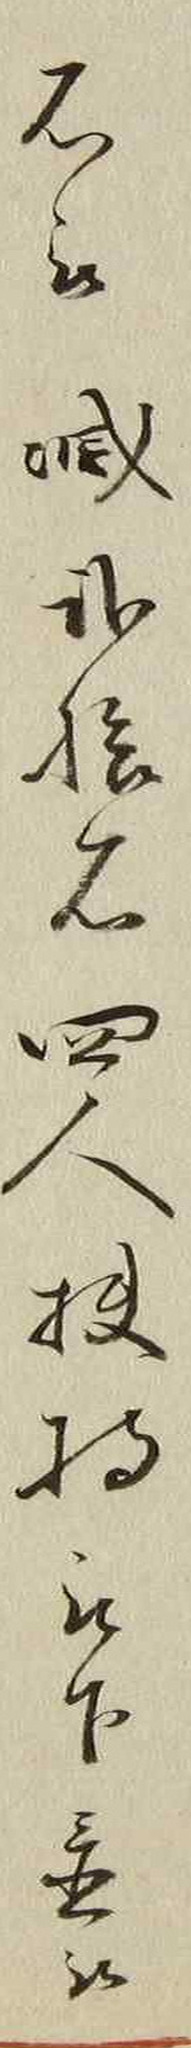石被減弐拾石四人扶持被下置被
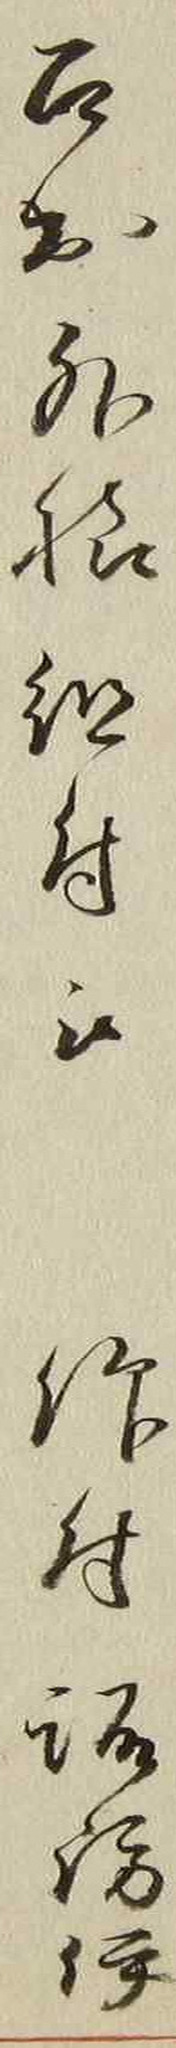召出外様組付被仰付諏訪伊
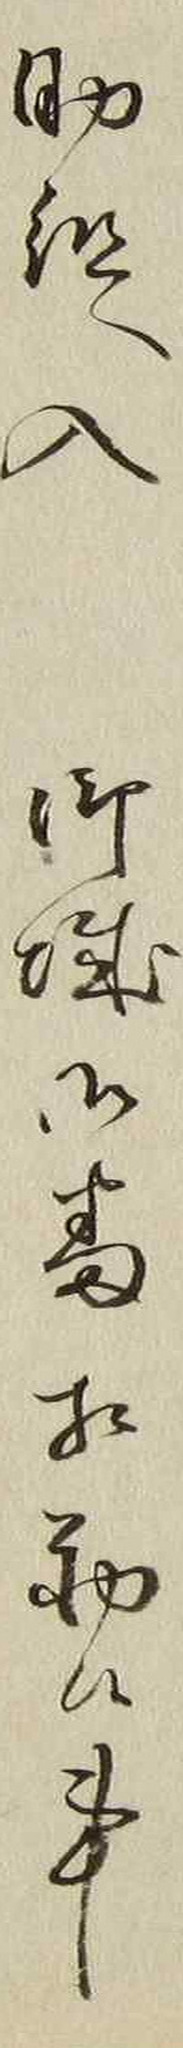助組へ入御城御番相勤候事
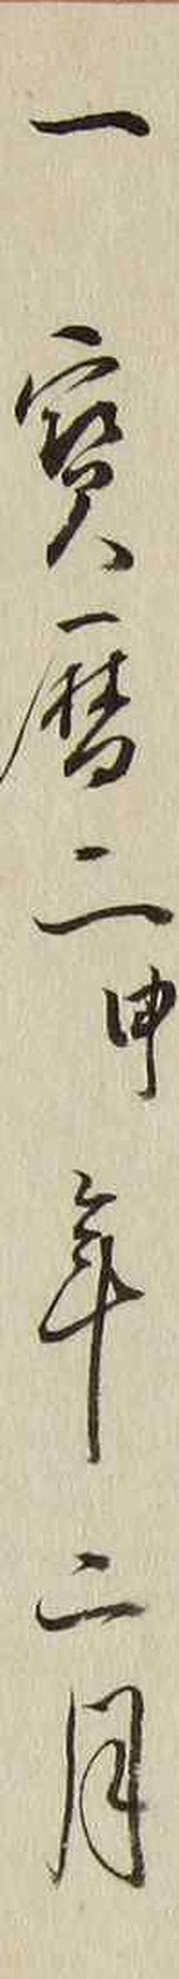一宝暦二申年二月
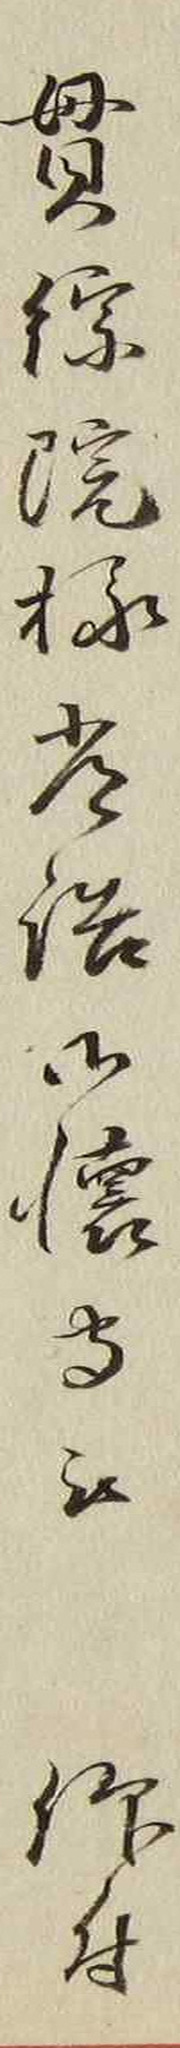貫綜院様常詰御懐守被仰付
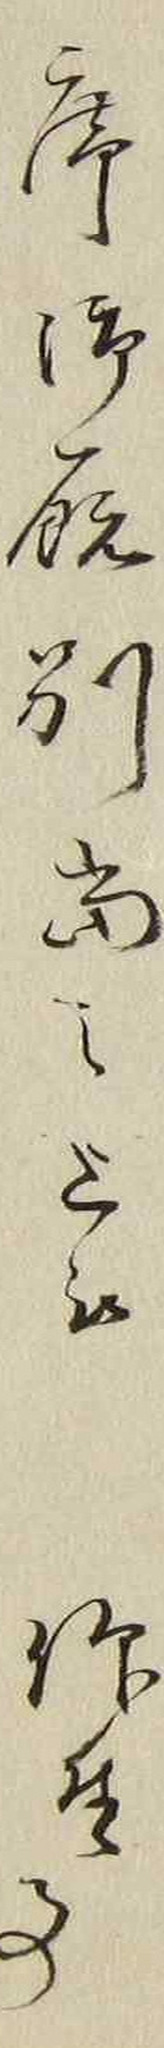席御厩別当之上被仰付候事
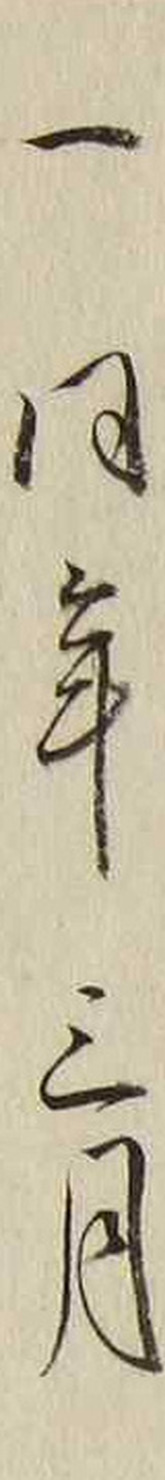一同年三月

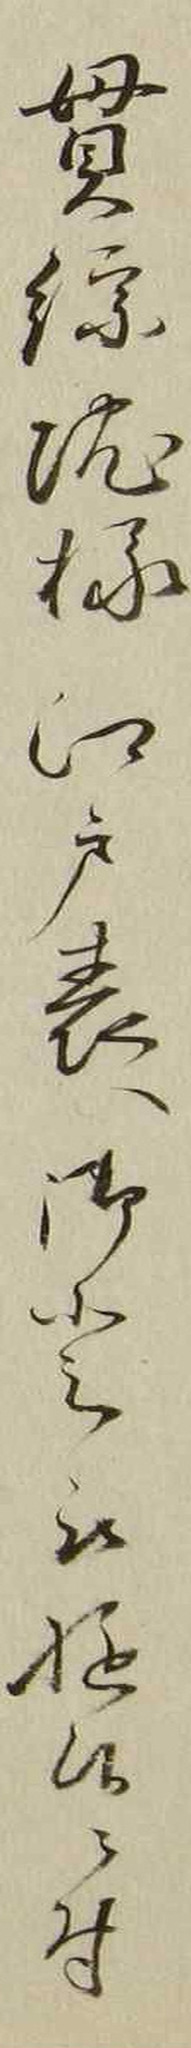貫綜院様江戸表へ御登被遊候ニ付
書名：諸士系譜　巻之28　い之部28
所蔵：会津若松市立会津図書館
